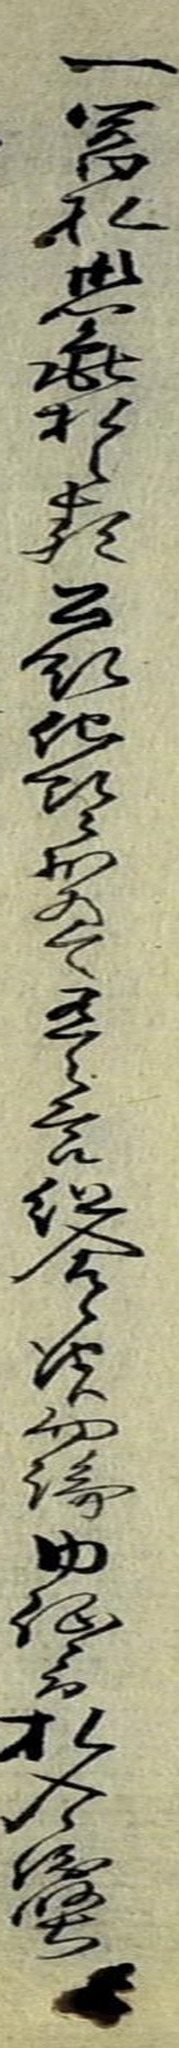一富札御鬮札之類公領他領におゐて有之節組合之儀は勿論内証に而札入候儀堅
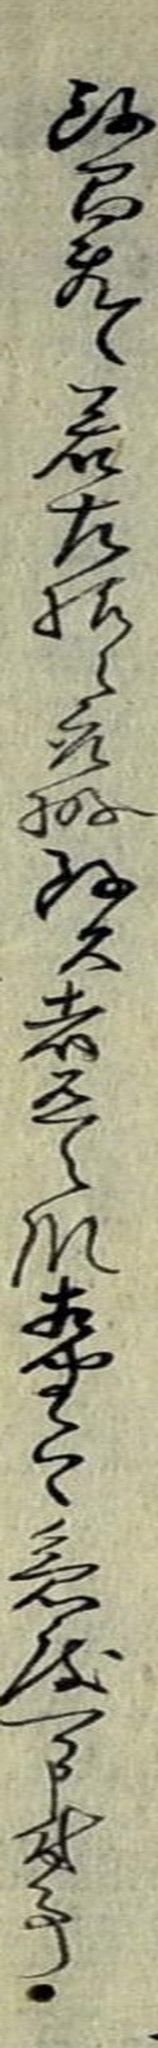致間敷候若左様之取扱致ス者有之段相聞候はゝ急度可申付事
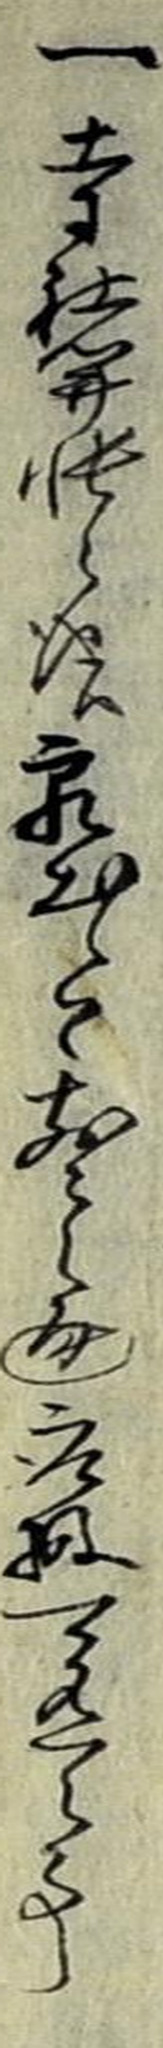一寺社開帳之儀は願出候はゝ前々之通取扱可有之事
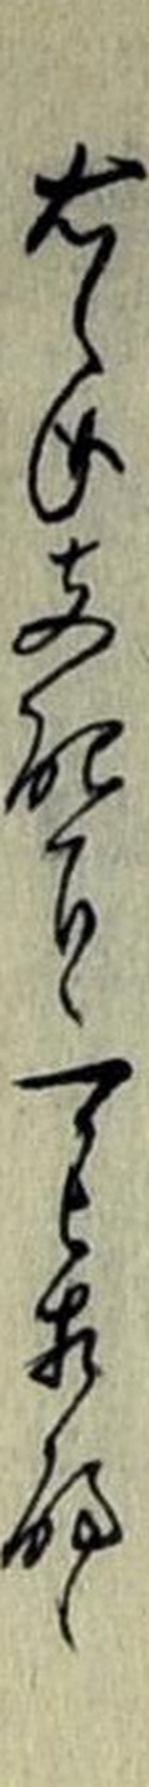右之趣支配下へ可被相触候
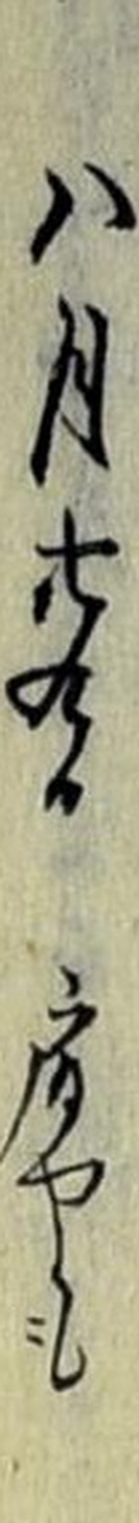八月廿九日府中へも
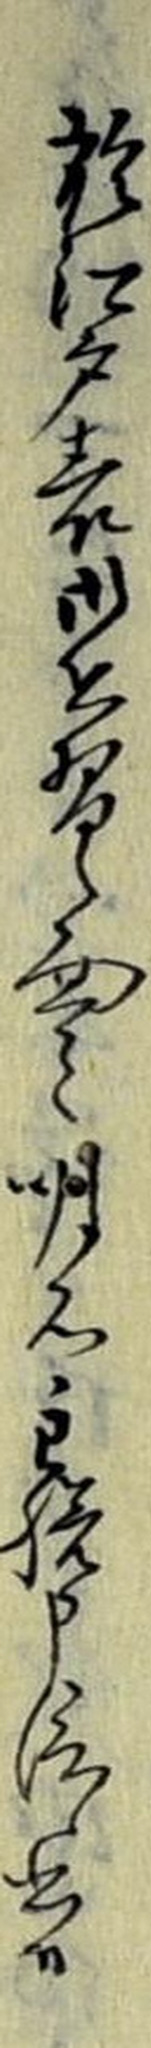於江戸表御近習之面々へ明石主膳申渡候書付
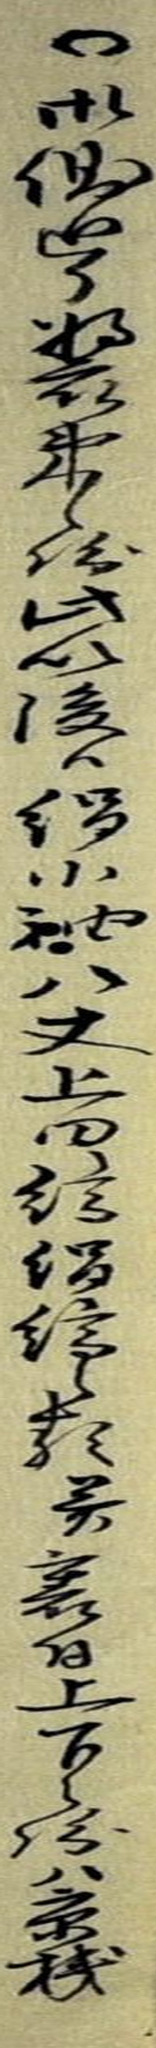〇御側廻り装束之儀此以後は絹小袖八丈上田縞絹縞之類并裏付上下之儀は京機
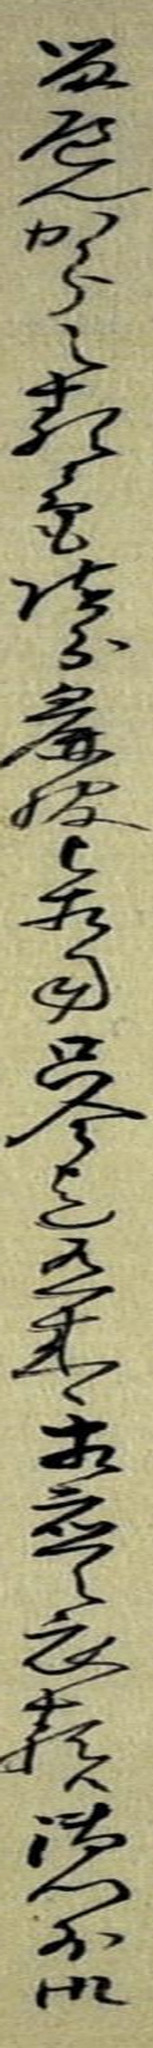留へんから之類に而も随分麁服被相用只今迄有来候相応之衣類は御門外御
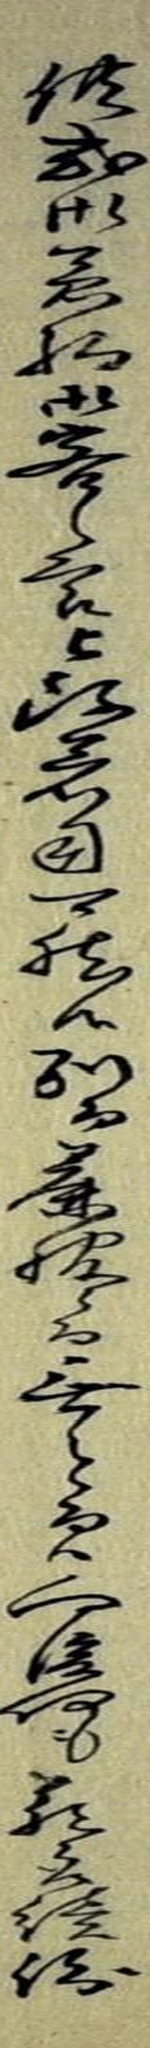供或御急約御客之節被致着用可然候別而麁服に而無之候而は向後何も難取続儀
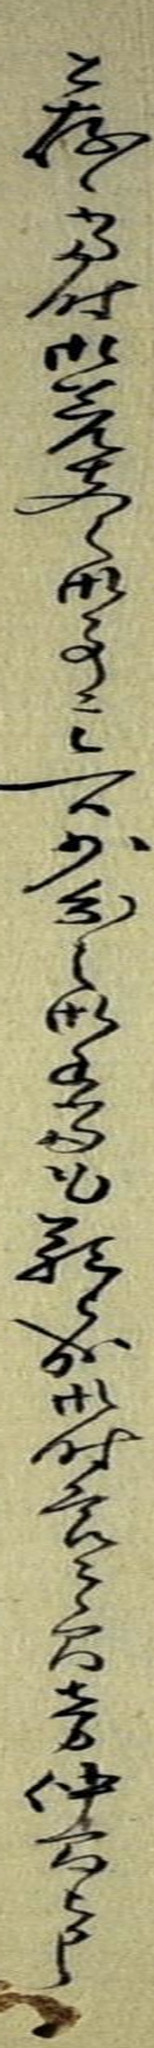と存候当時御差支之御事に候へは少分之御手当も難被成御時節に候間旁仲間被申
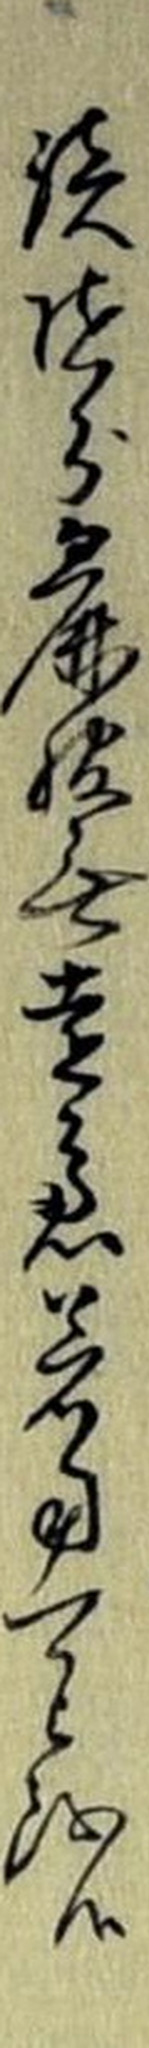談随分麁服無遠慮着用可被致候
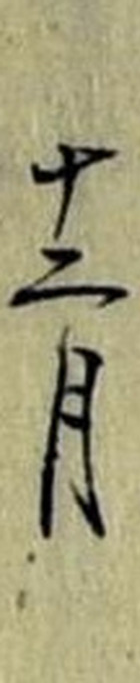十二月
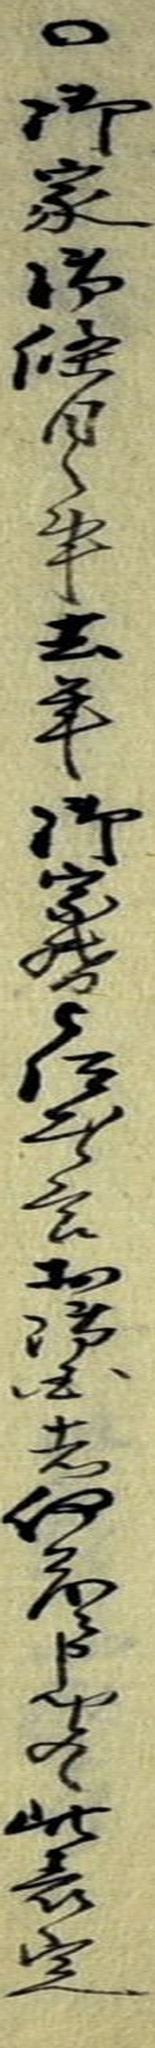〇御家御条目之事去年御家督被仰出候節於御国者何茂に申聞候此表定
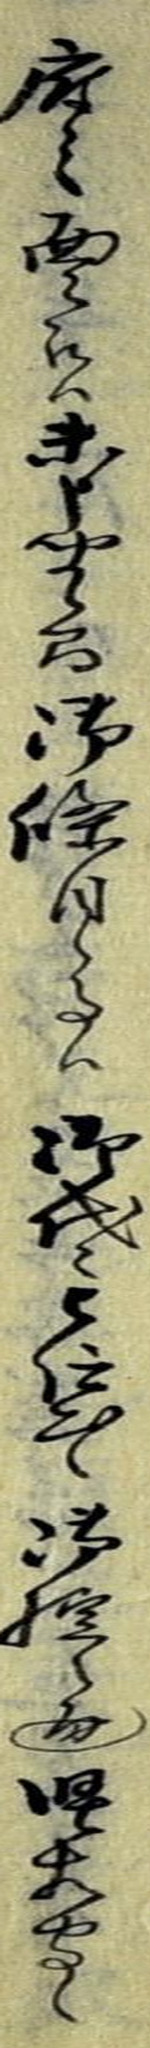府之面々えは未申聞候間御條目之事は御代々被仰出候御掟之通堅相守候
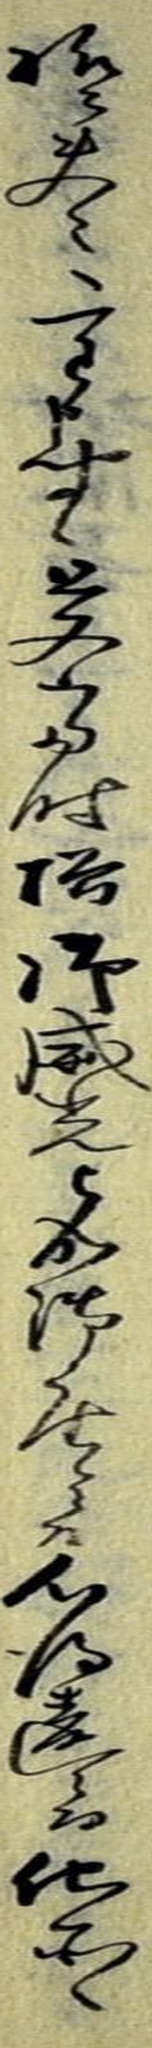様に夫々へ可被申聞候且又当時増御威光被成御座候に付心得違に而他所へ
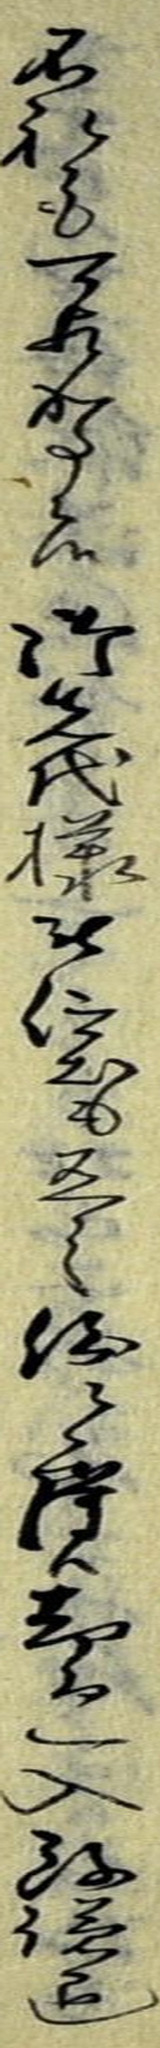不礼にも可相成事に候御先代様被仰出も有之儀に候得は却而一入致謙退
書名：命令之部 二
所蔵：福井県文書館 Fukui Prefectural Archives
